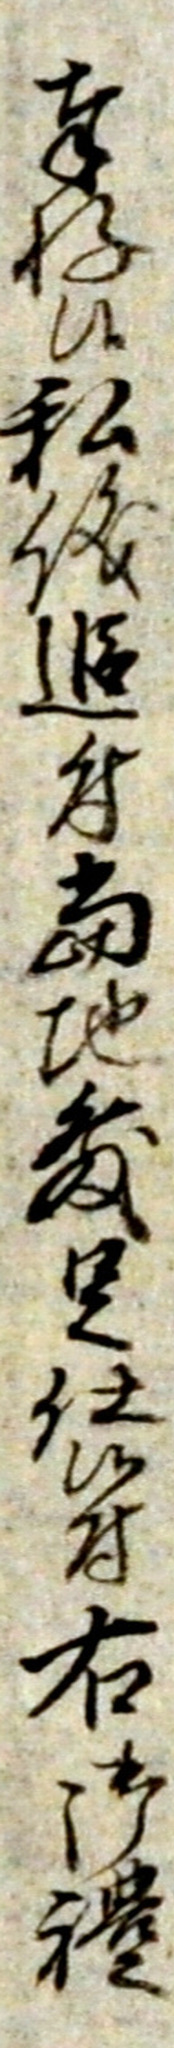奉存候私儀追付当地敷足仕候付右御礼
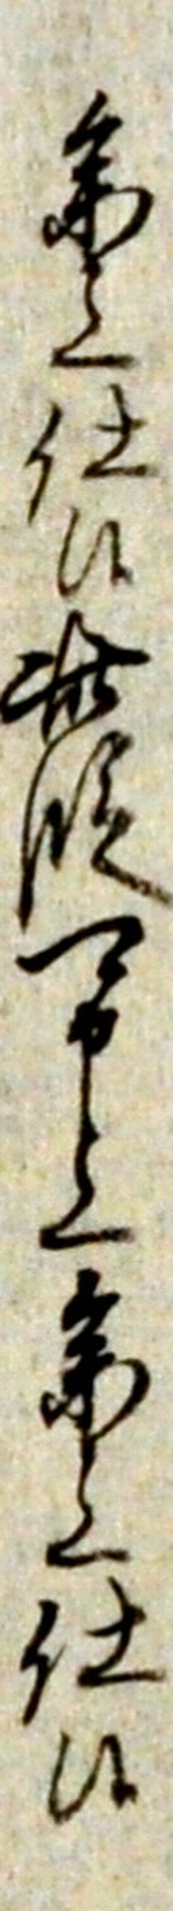参上仕候此段可申上参上仕候
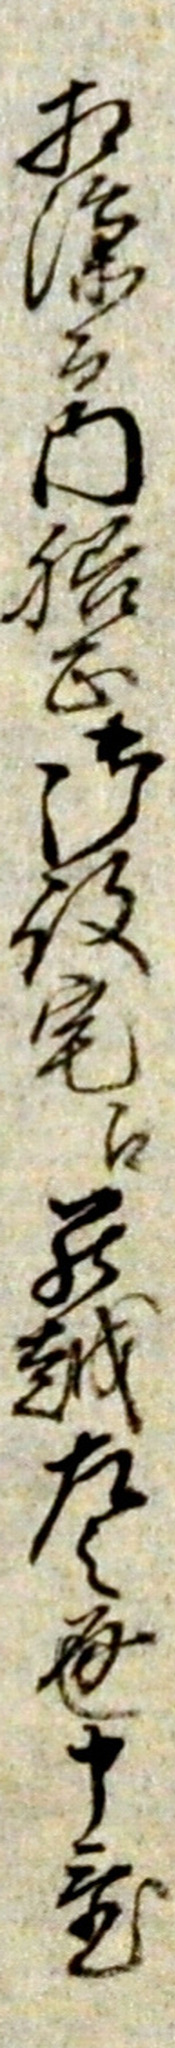相添而内膳正御役宅江罷越左之通申置
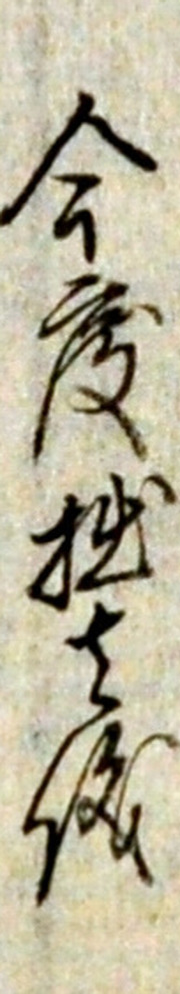今度拙者儀
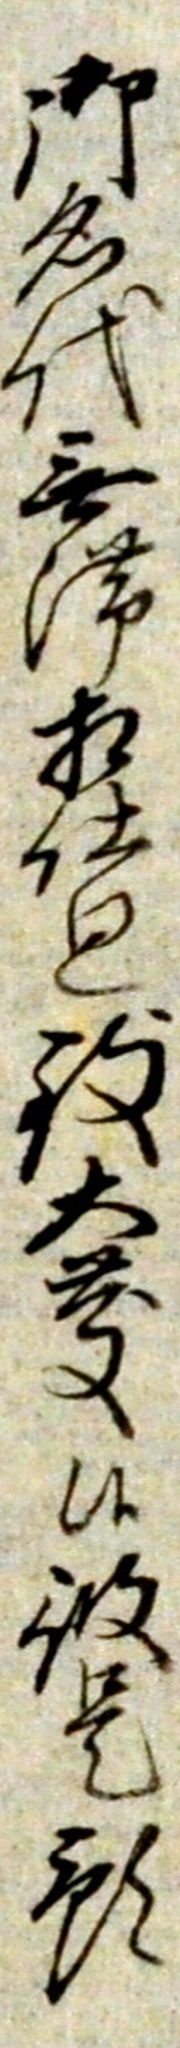御名代無滞相仕廻致大慶候彼是預
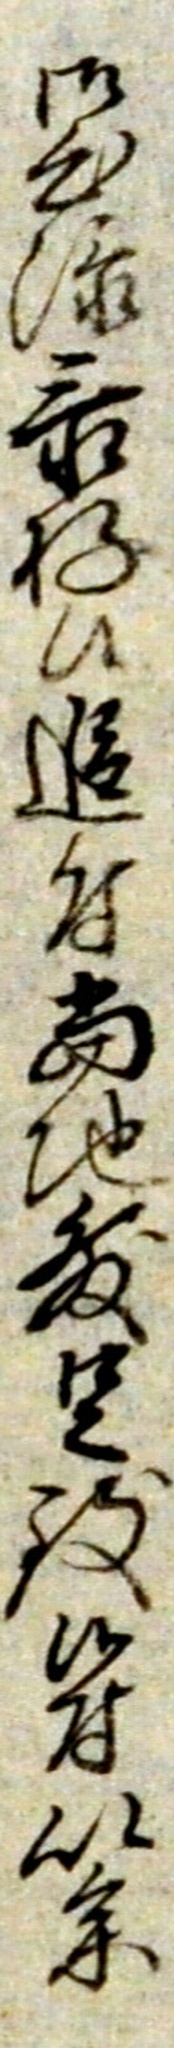御心添置存候追付当地敷足致候付以参
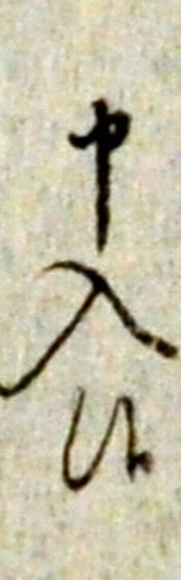申入候
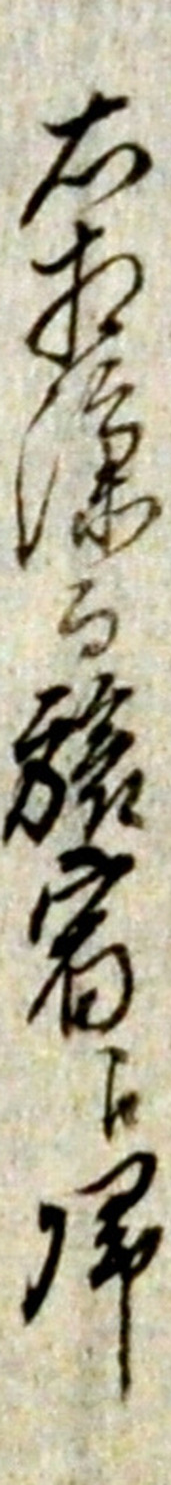右相添而旅宿え帰
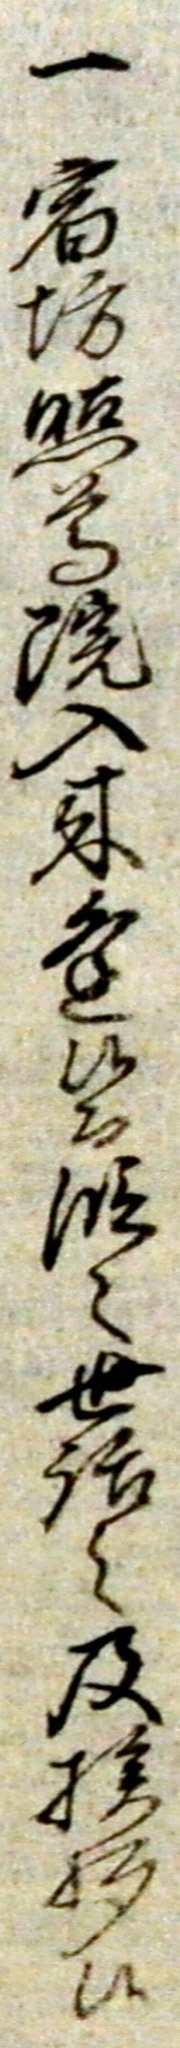一宿坊照尊院入来逢候而段々世話之及挨拶候
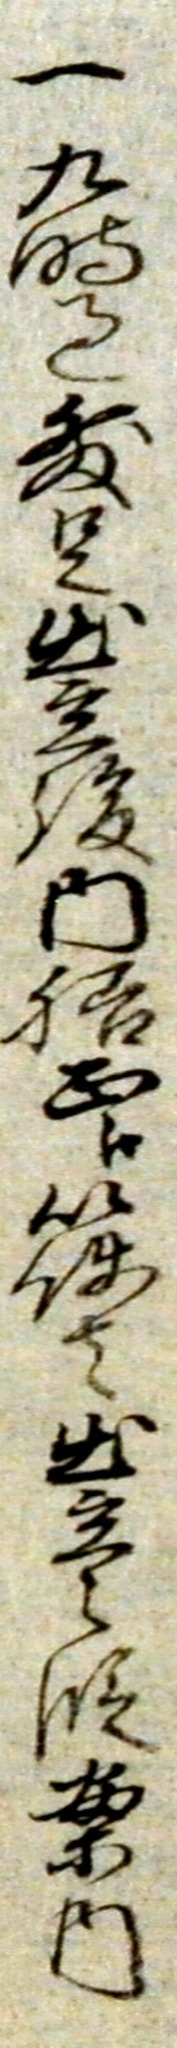一九時過発足出立後内膳正江以使者出立之段案内
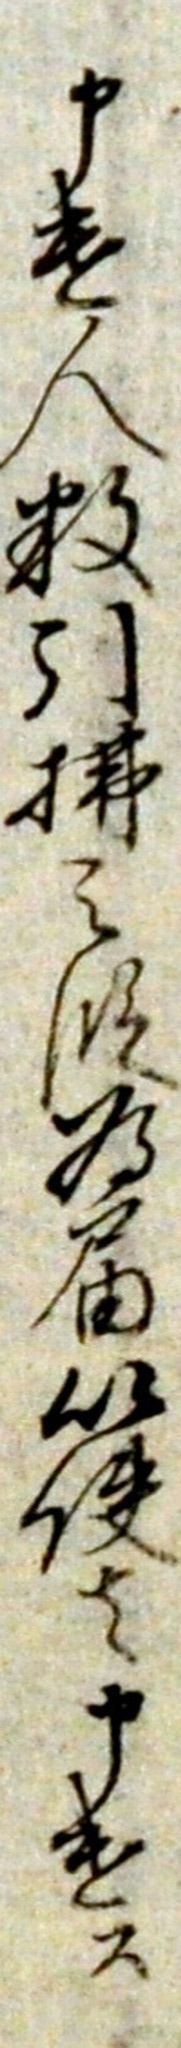申遣人数引払之段為届以使者申遣ス

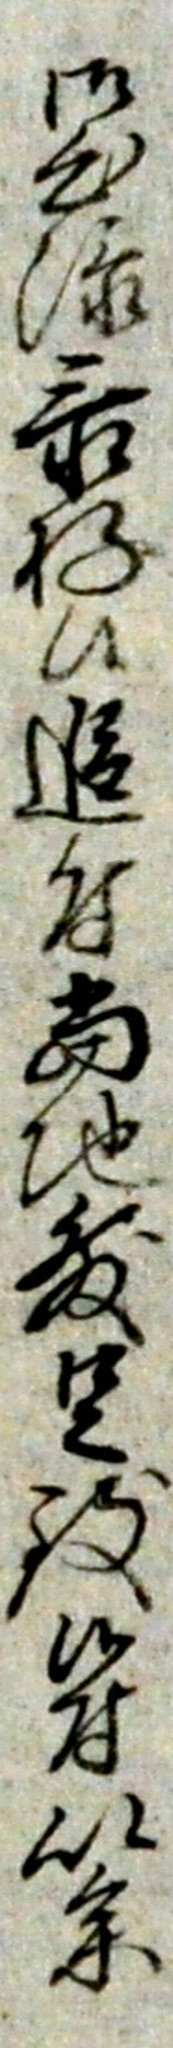御心添忝存候追付当地敷足致候付以来
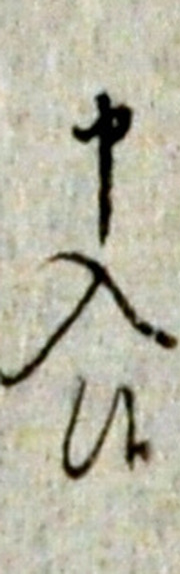申入候
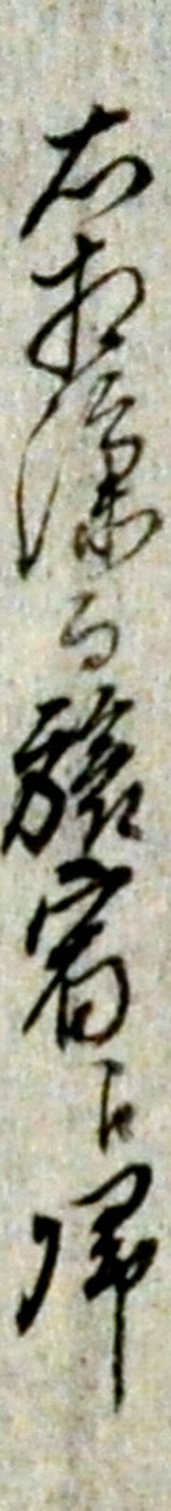右相済而旅宿江帰
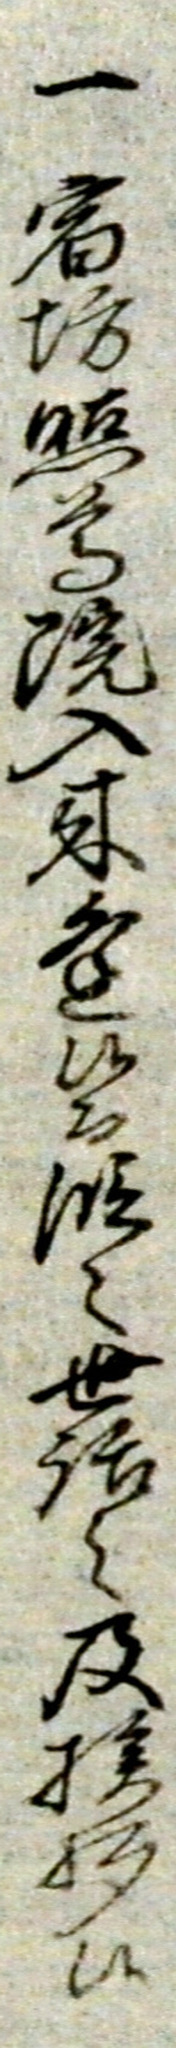一宿坊照尊院入来逢候而段々世話ニ及挨拶候
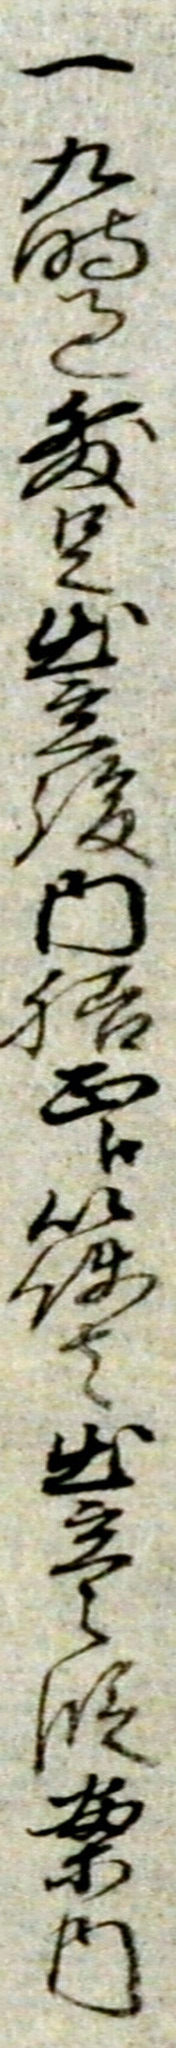一九時過敷足出立後内膳正江以使者出立之段案内
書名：日光御名代相勤候節ノ留
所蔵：伊那市立高遠町図書館・合同会社AMANE
